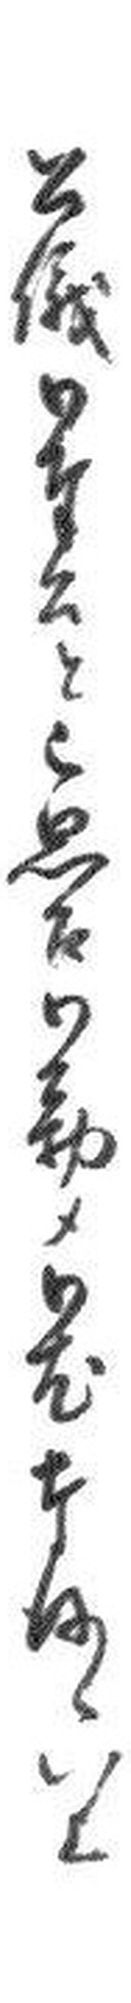公儀御奉公と被思召御勤メ御尤奉存候以上
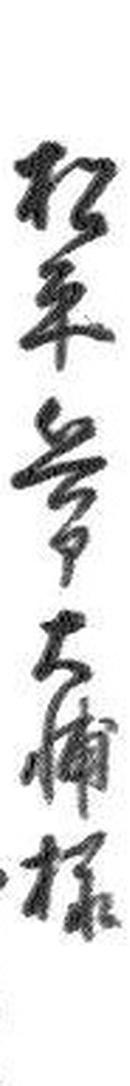松平兵部大輔様
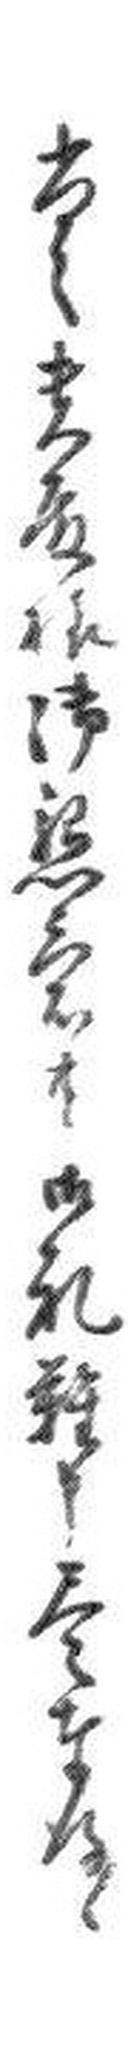尚々貴殿様御懇意共御礼難申尽奉存候
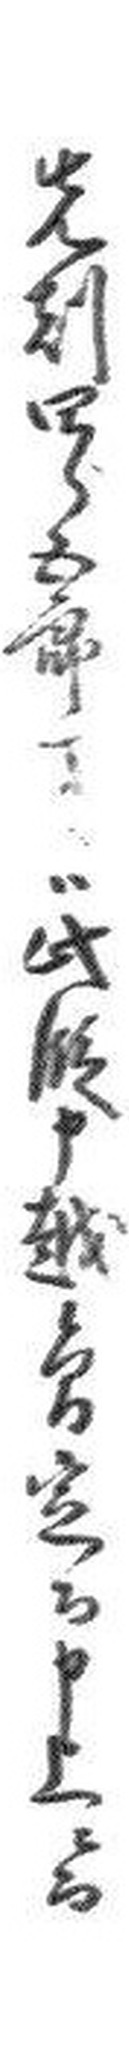先刻四郎五郎殿へハ此段申越候間定而申上ニ而
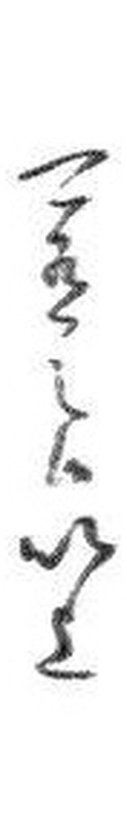可有之候以上
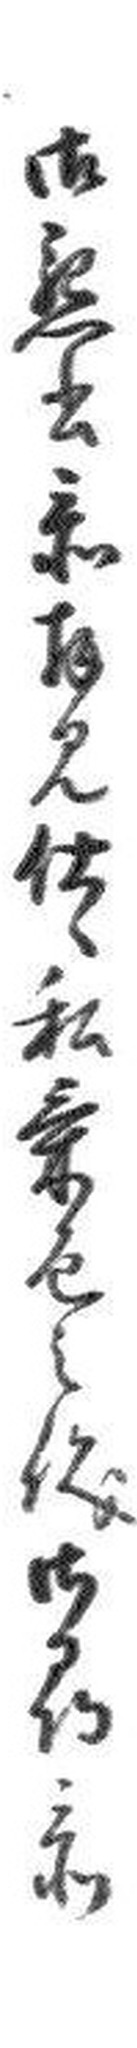御懇書忝拝見仕候私気色之儀御尋忝
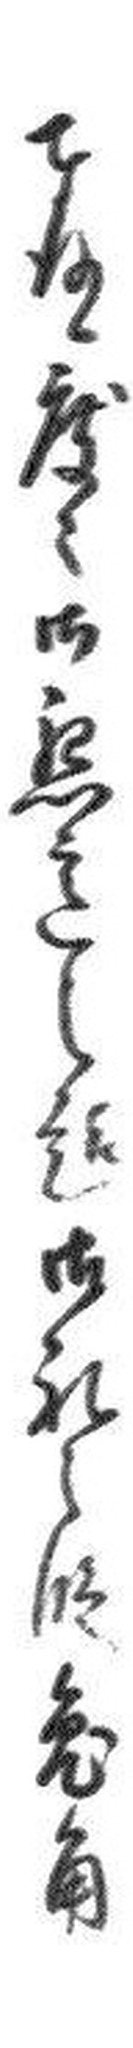奉存候度々御懇意之趣御礼之段兎角
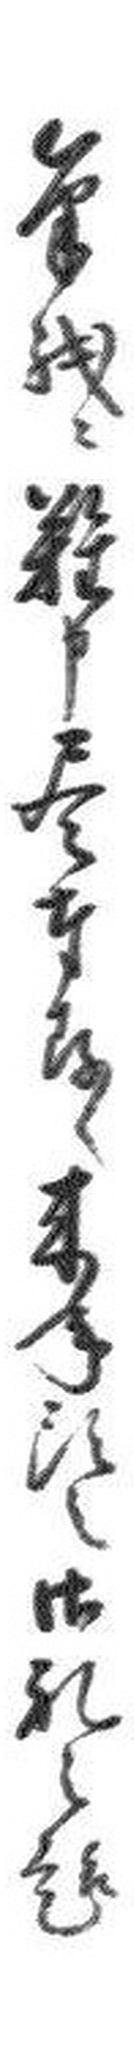筆紙ニ難申尽奉存候来年頭之御礼之趣

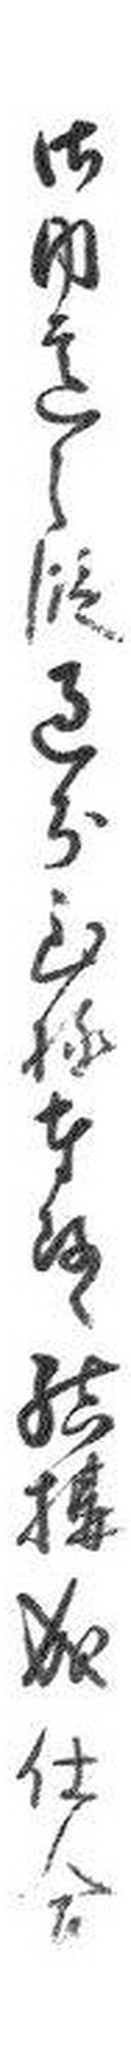御内意之段過分至極奉存候結構成仕合
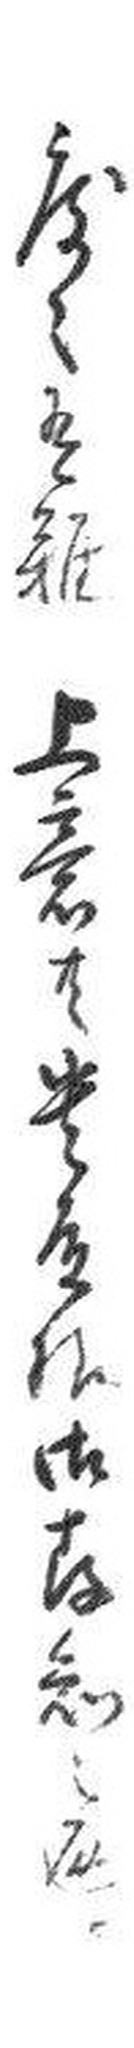度々有難上意共貴殿様御存知之通
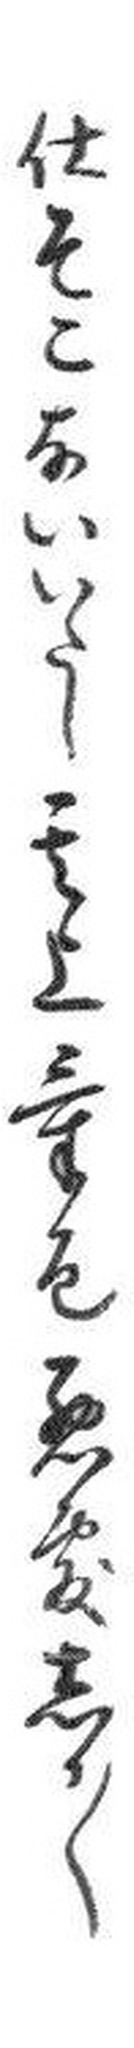仕そこないいたし其上気色悪敷しか〳〵
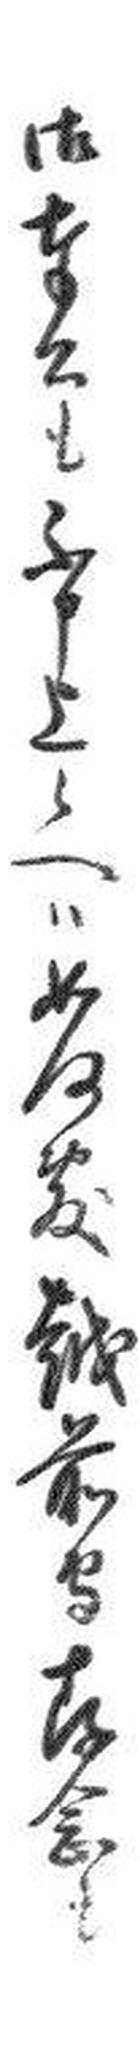御奉公も不申上候ヘハ如何敷越前守存念も
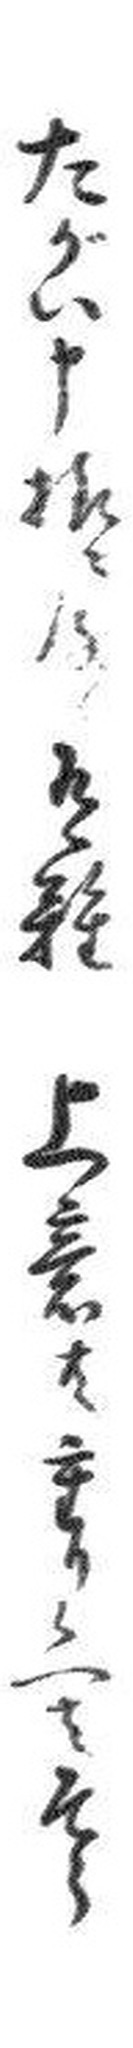たがい申様ニ存候有難上意共重り候ヘ者そら
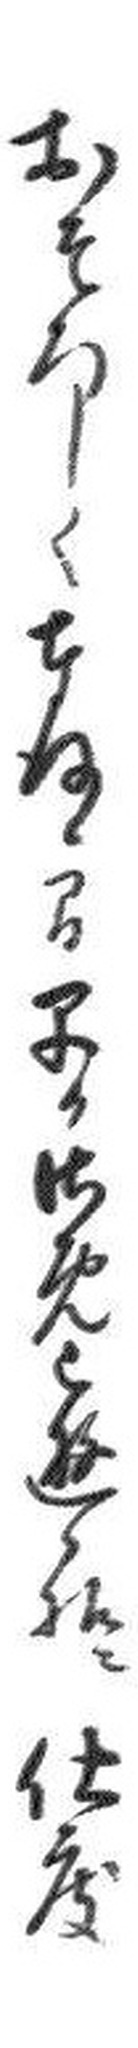おそろしく奉存候間早ク御免被遊候様ニ仕度
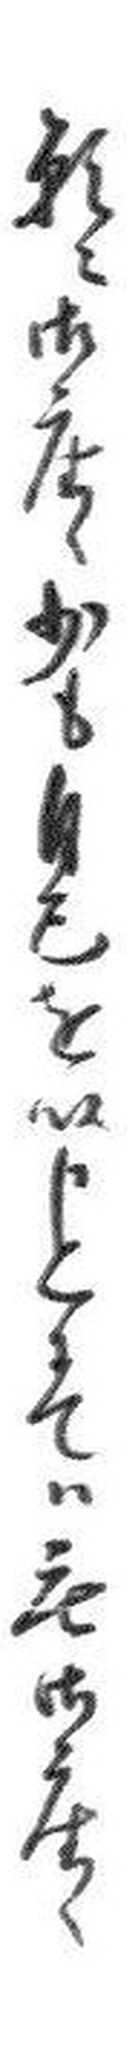願ニ御座候少も自己を以申上にてハ無御座候
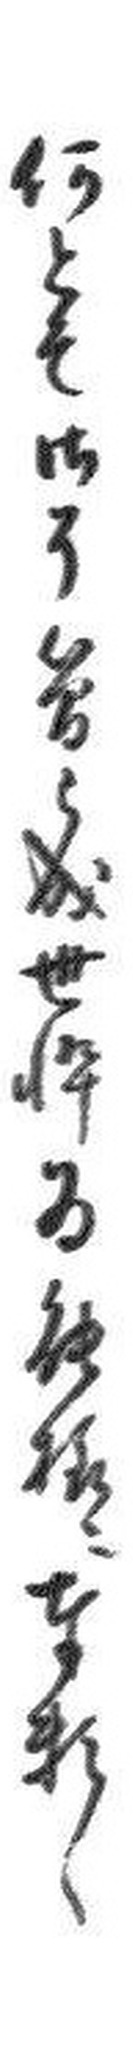何とそ御了簡被成世忰為能様ニ奉頼候
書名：家譜 十一 昌親公 従延宝二年到延宝四年八月
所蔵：福井県文書館 Fukui Prefectural Archives
